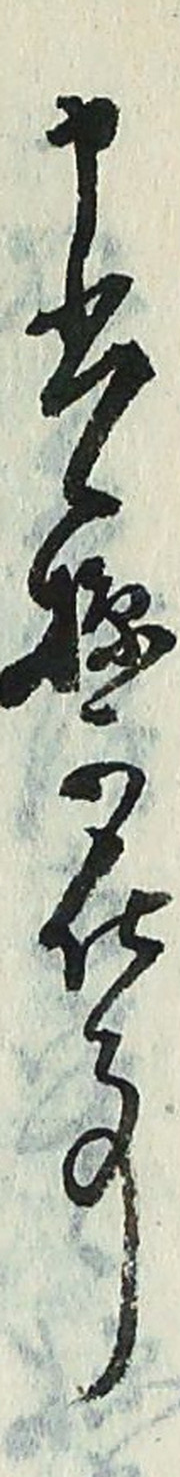申出候様可仕事
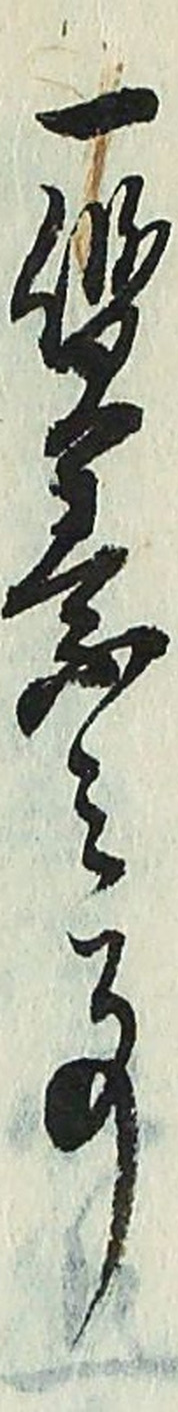一質素之事
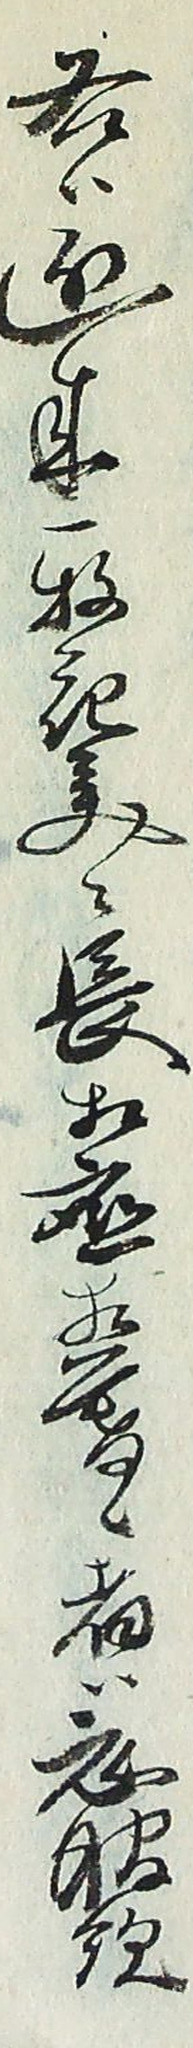右ハ近来一牧花美ニ長相應相暮候者ハ衣服飲
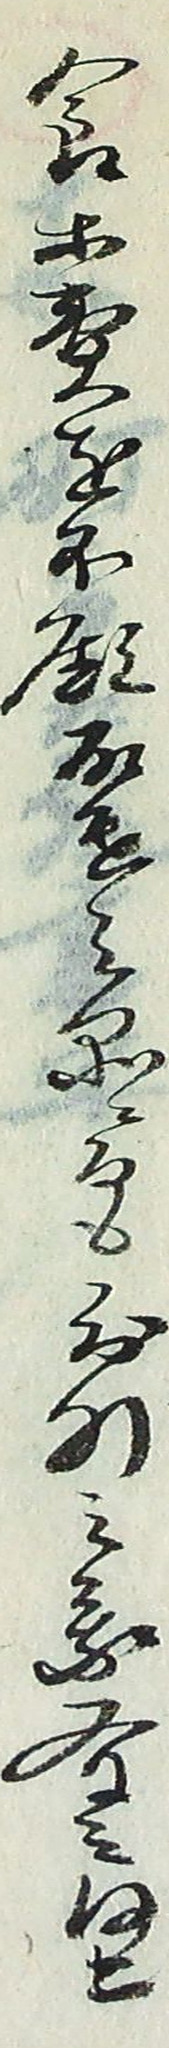食等費を不顧取遣之品ニ而も分外之義有之何ニ
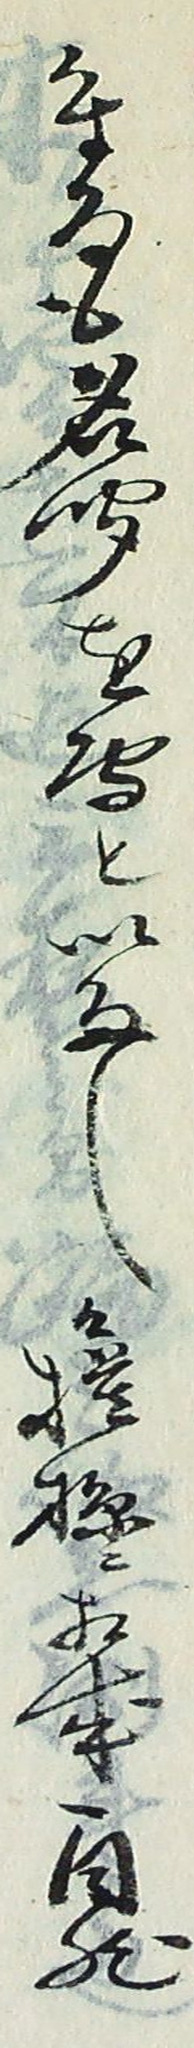付而も名聞を専といたし候模様ニ相成自然
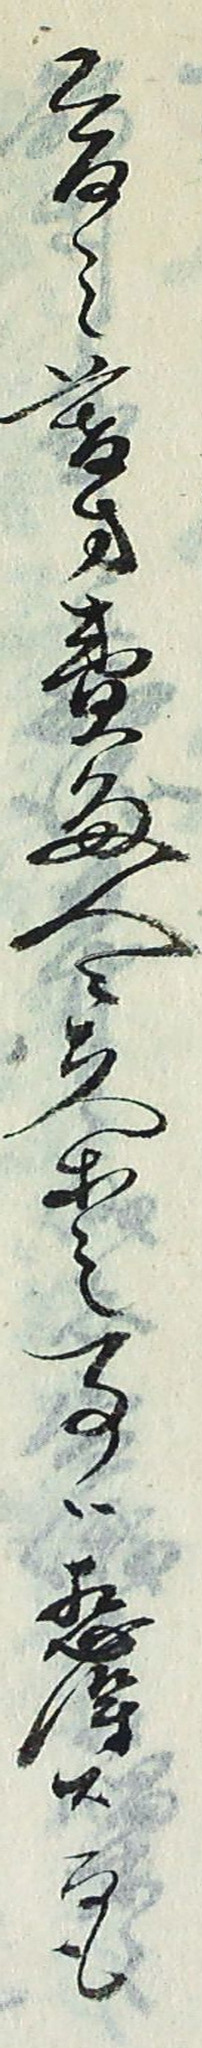今日之暮方費多人々夫等之事ハ相心得候而も
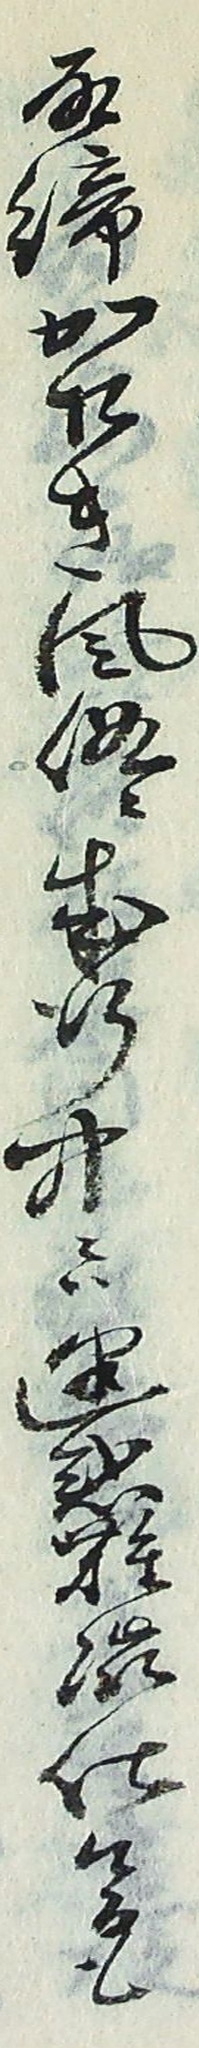取締かたき風俗ニ成行中ニハ迷惑難渋仕候而も
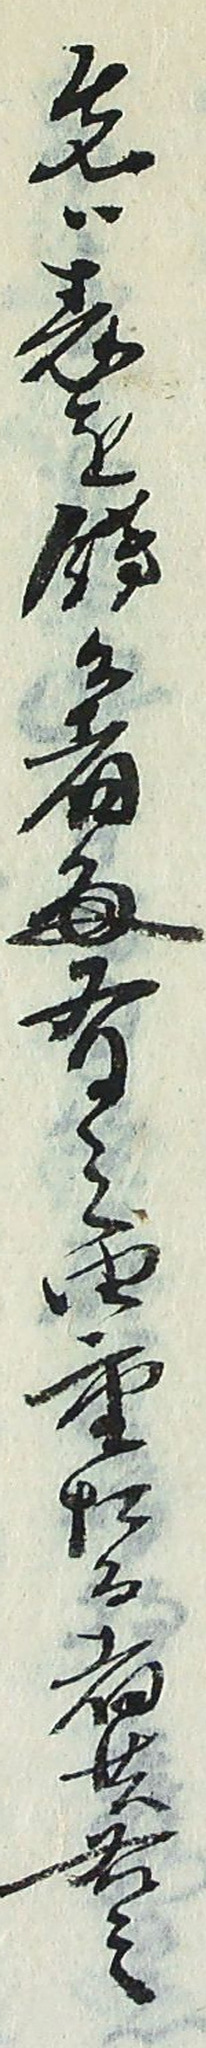先ハ表を飾候者多有之由重たる者共右之
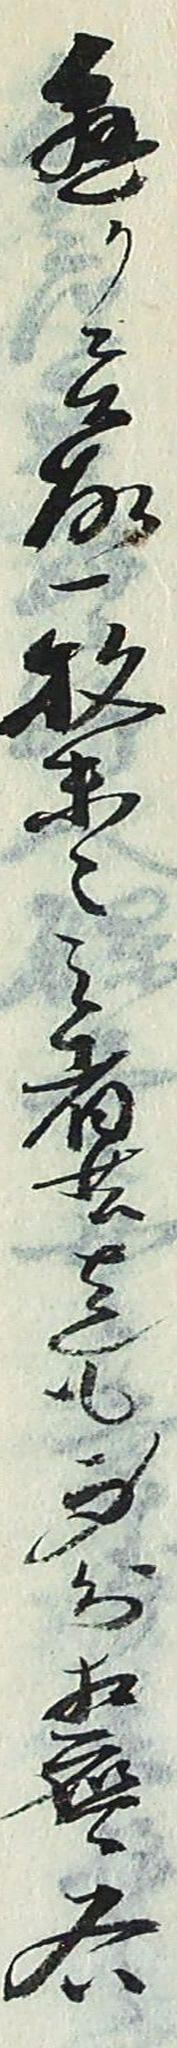懸りニ候故一牧末々之者共迄も身分相應ニ右
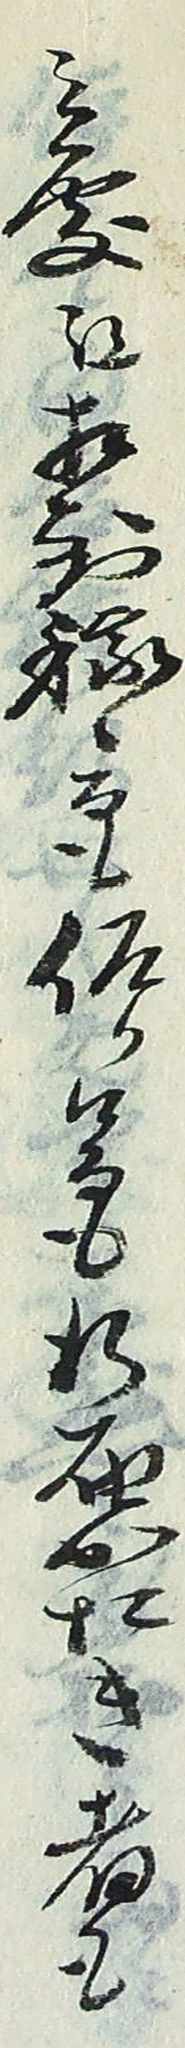之處江相到稼候而も作り候而も行届かたき者も
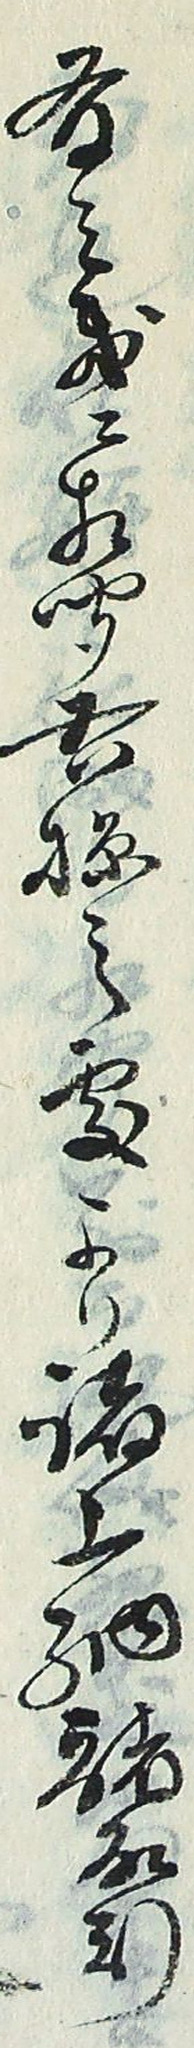有之義ニ相聞右様之處より諸上納諸取引
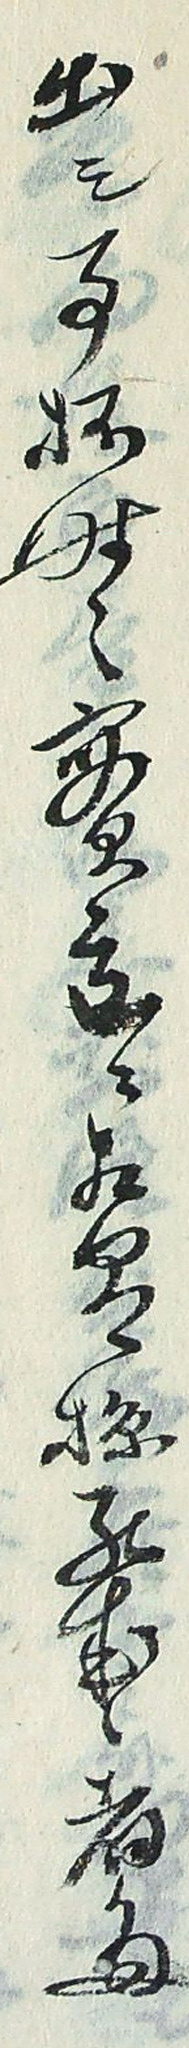出シ事抔時々實意ニ相欠候様罷成候者多
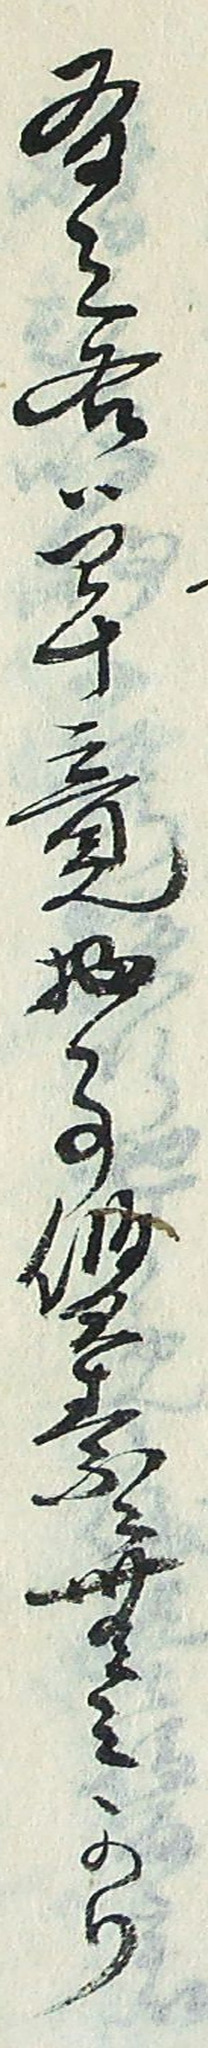有之右ハ畢竟物事質素ニ無之より

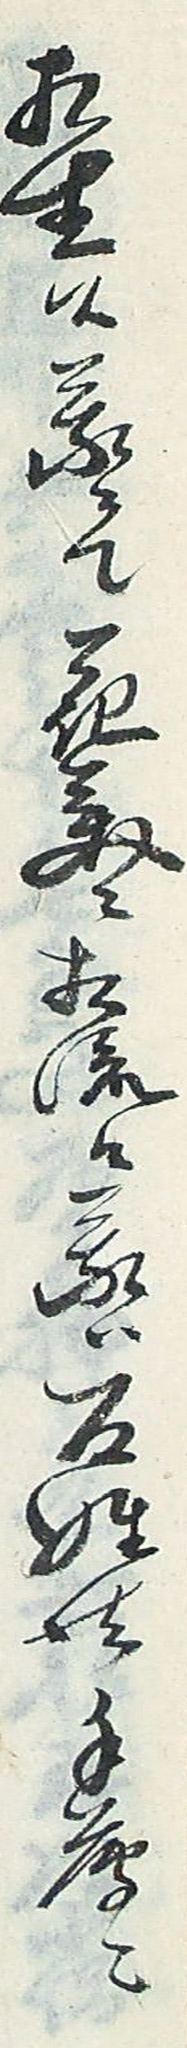相生候義ニて花美ニ相流候義ハ百姓共手薄ニ
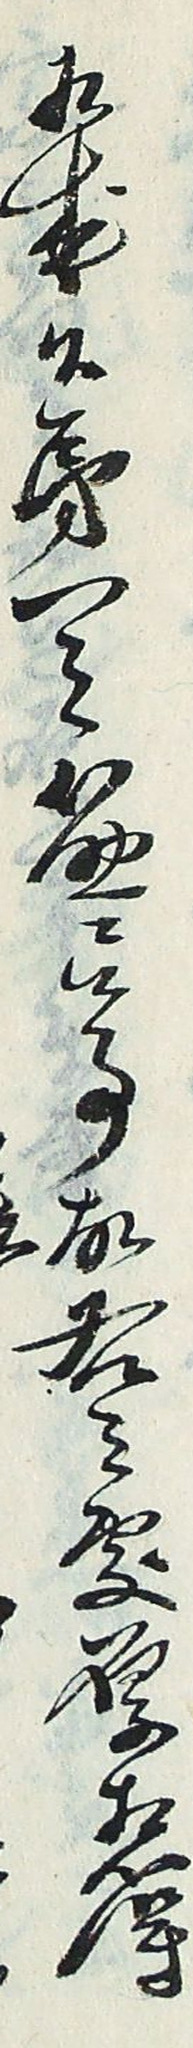相成候第一之筋ニ候事故右之處厚相心得
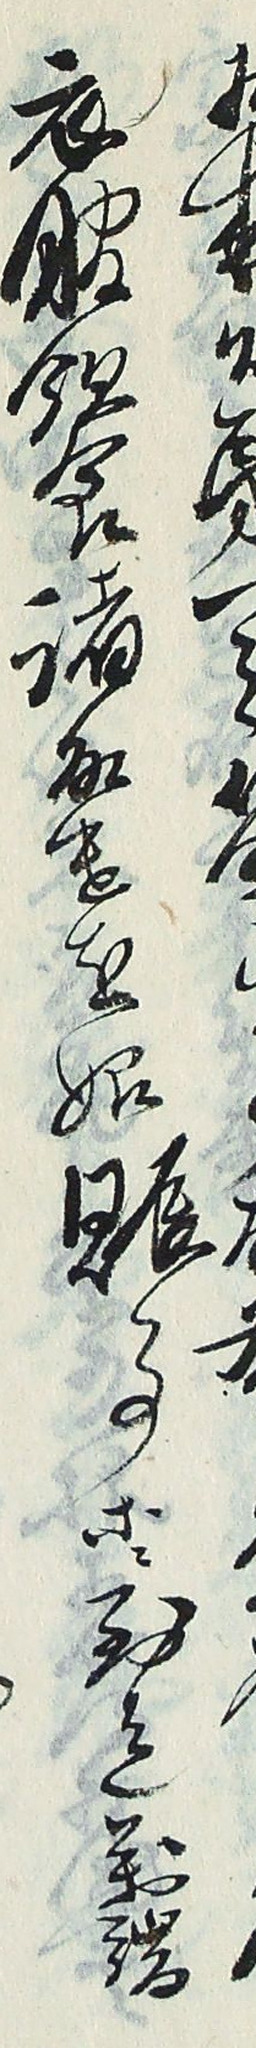衣服飲食諸取遣を始賑事等ニ到迄萬端
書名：諸御趣意書并御下知向之写
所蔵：鳴門教育大学 Naruto University of Education
